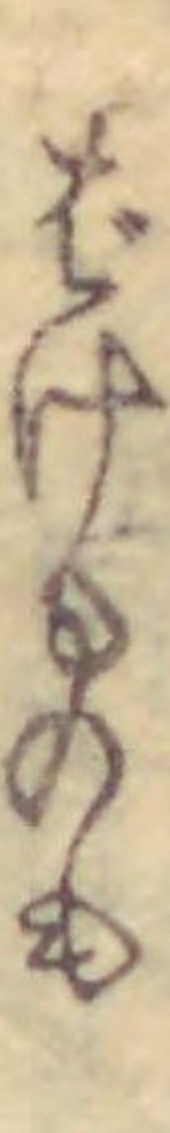ばけものも
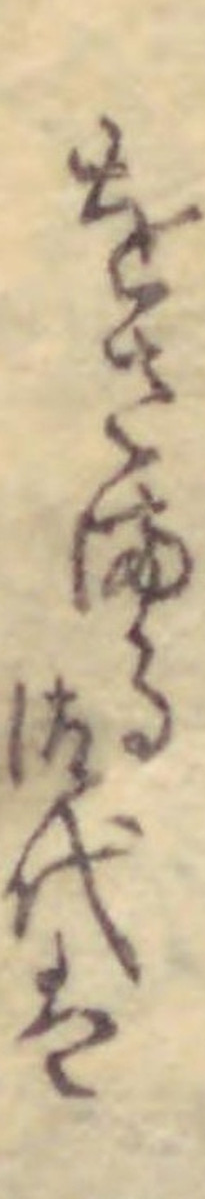をさまる御代は
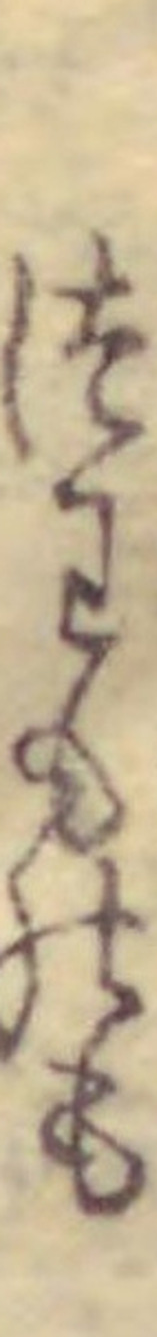つわものも
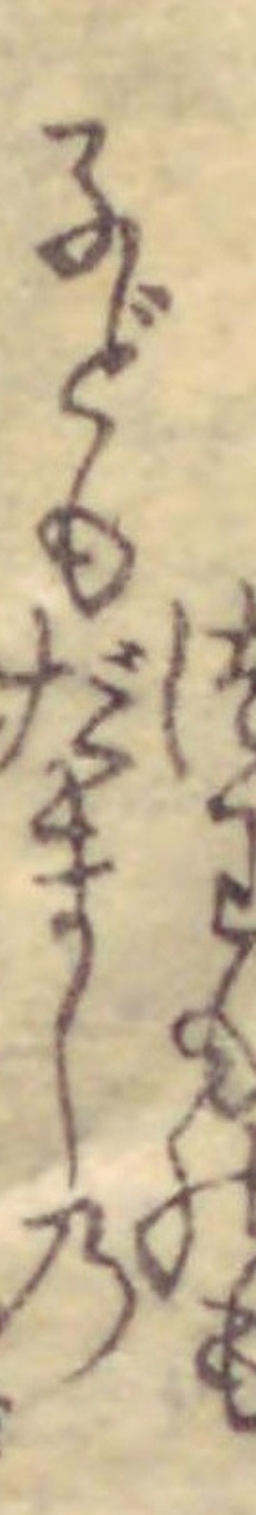子どもだましの
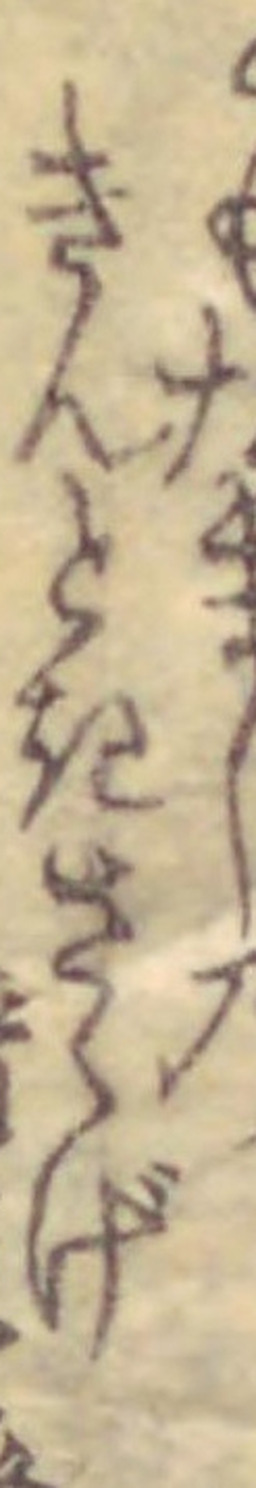きんときさゝげ
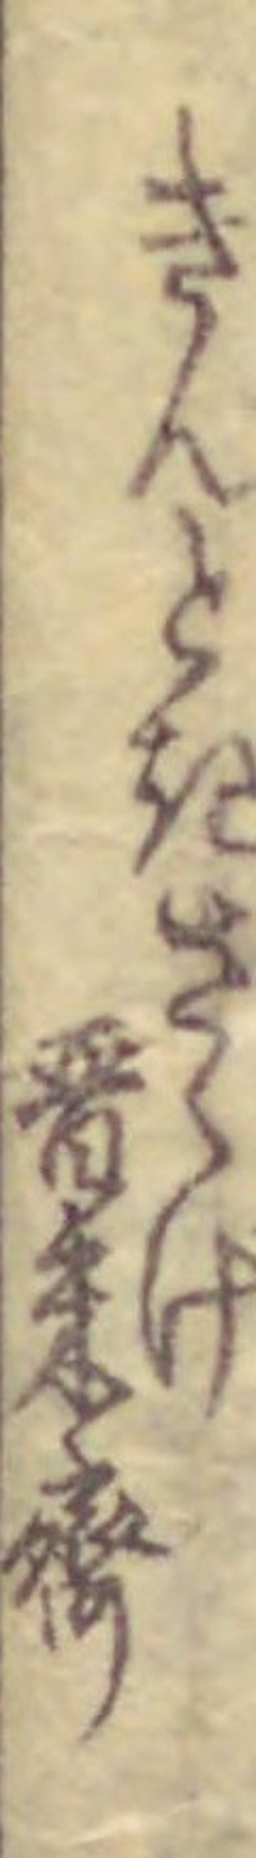晋米齋
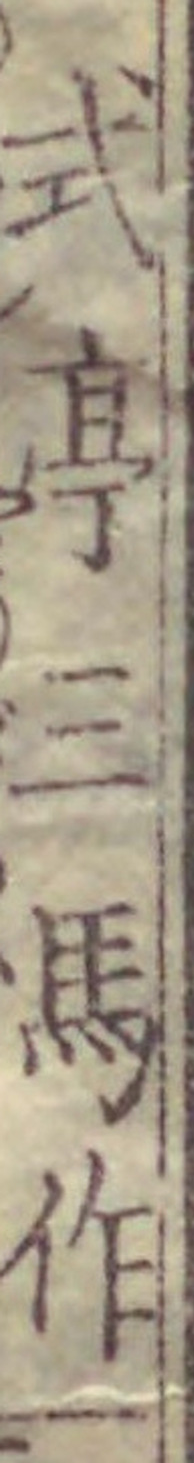式亭三馬作
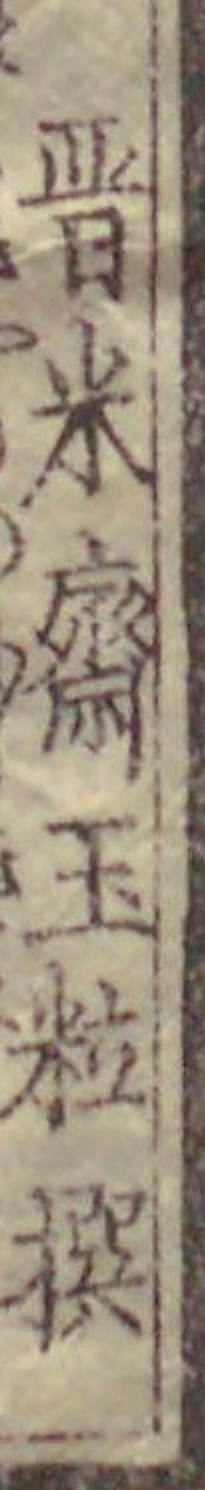晋米斎玉粒撰
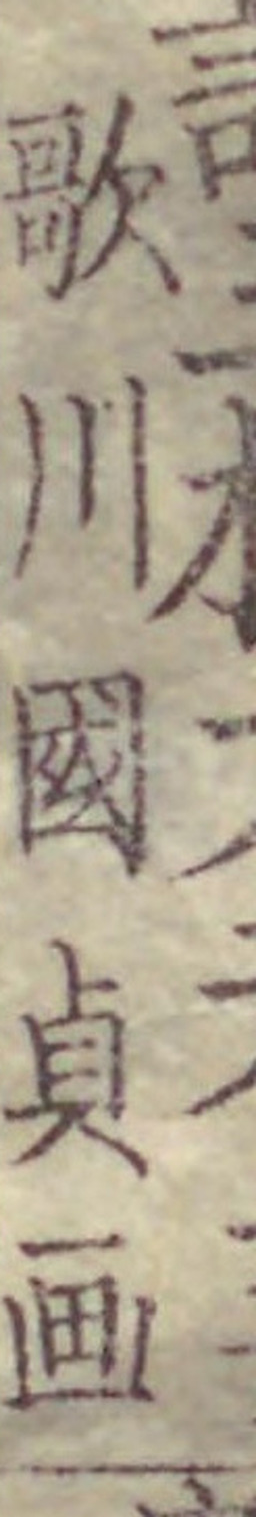歌川国貞画
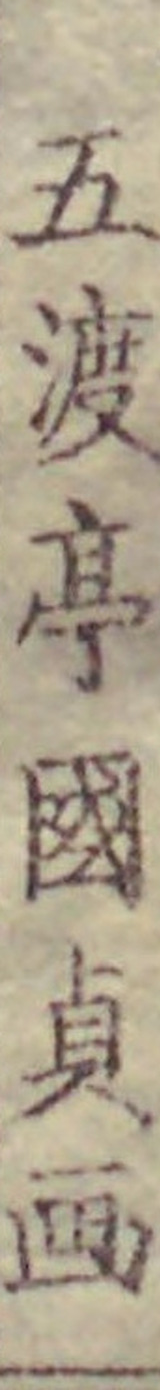五渡亭国貞画
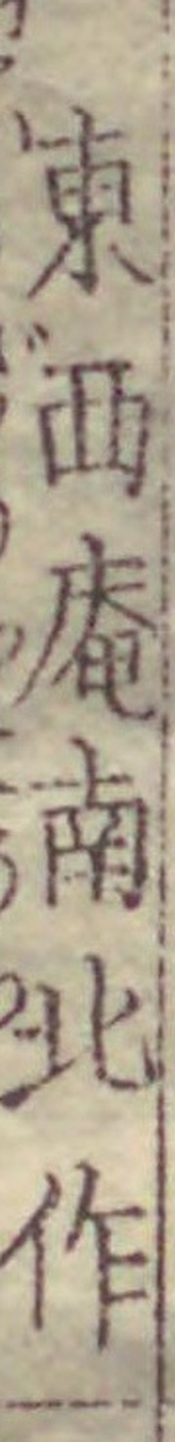東西庵南北作
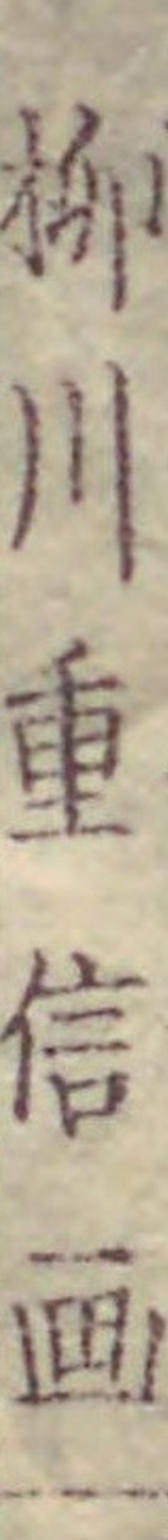柳川重信画
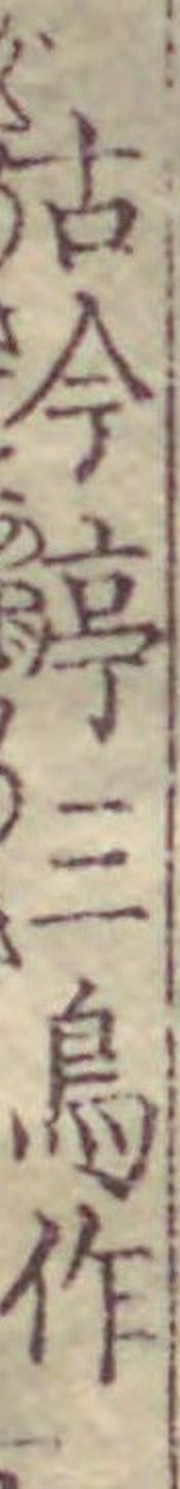古今亭三鳥作
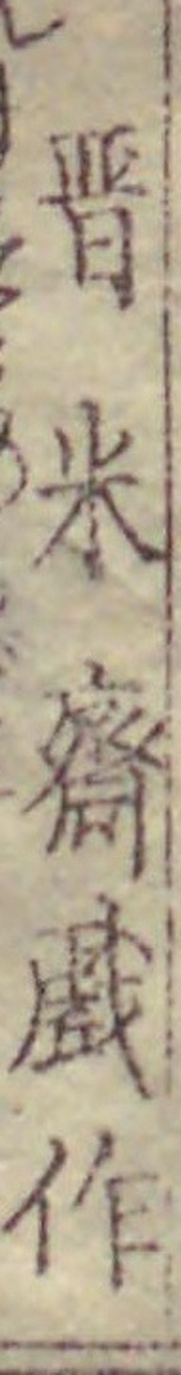晋米斎戯作
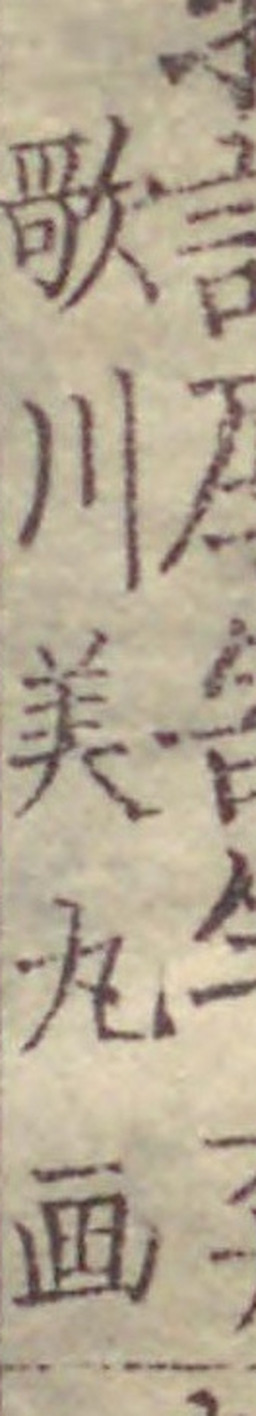歌川美丸画
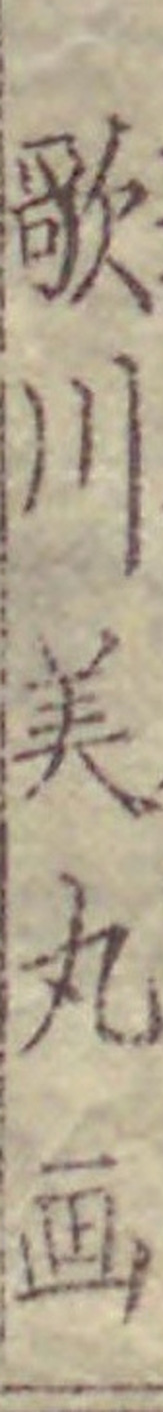歌川美丸画
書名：化物世帯氣質
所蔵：国立国会図書館 National Diet Library, JAPAN
